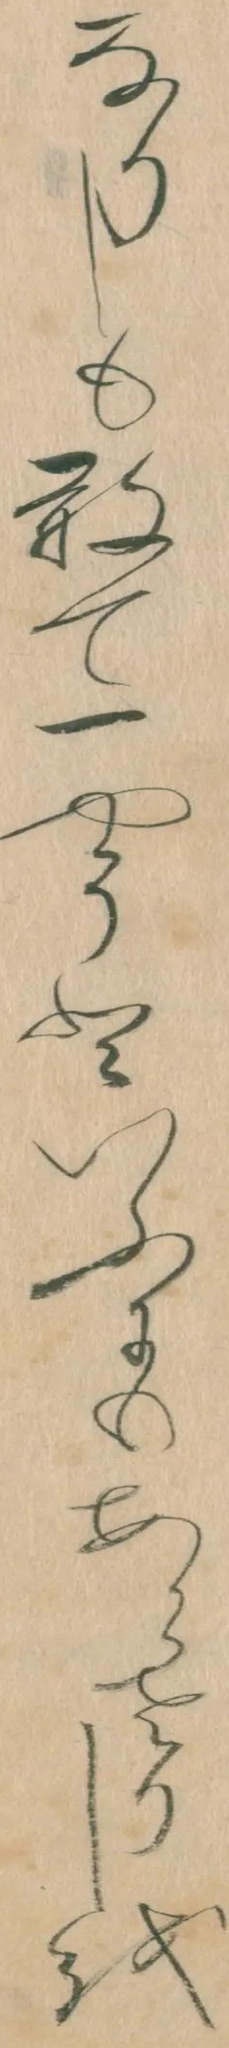なりしも敢て一やうといふにもあらさりしを
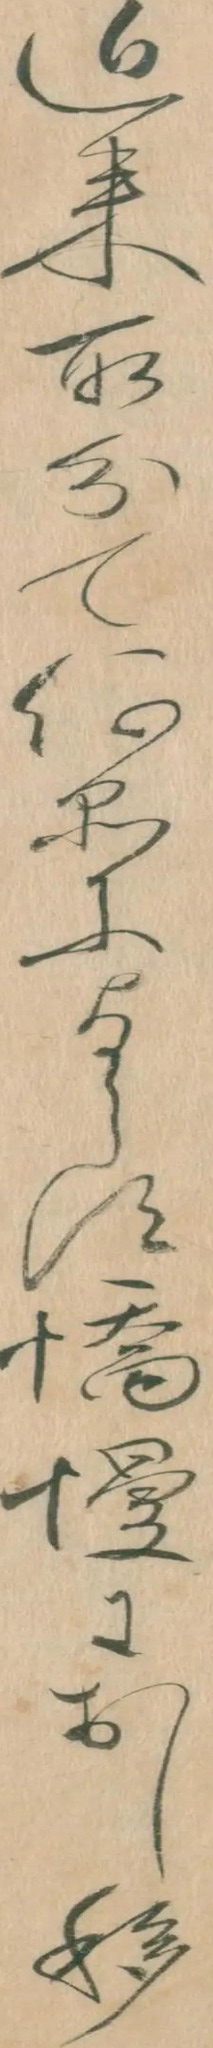近来取分て何品によらす憍慢におし移
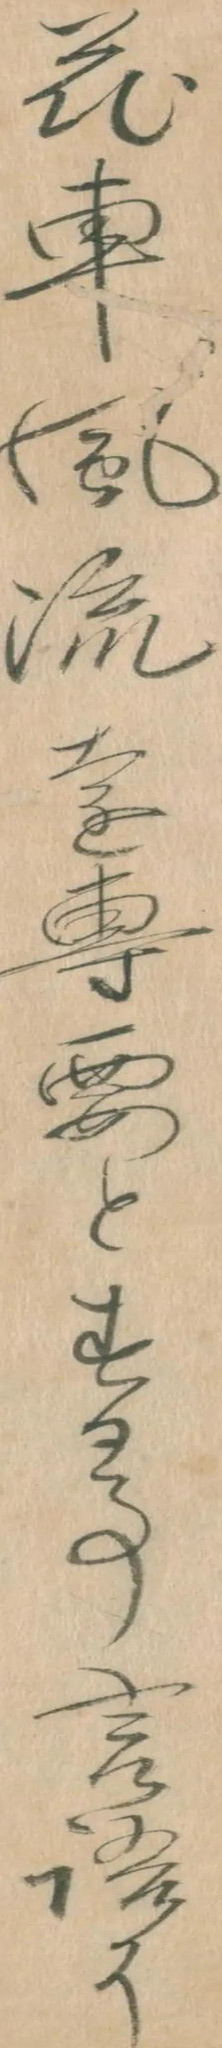花車風流を専要とする事言語に
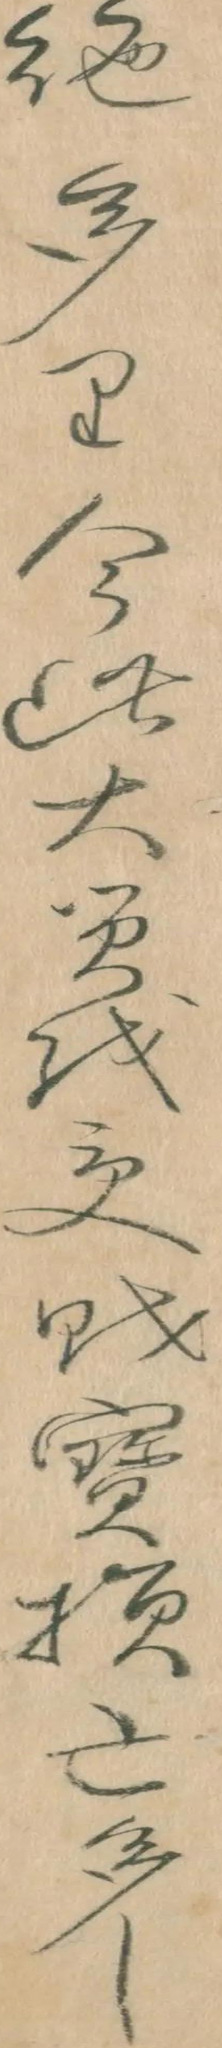絶たり今此大災を受財寶損亡多し

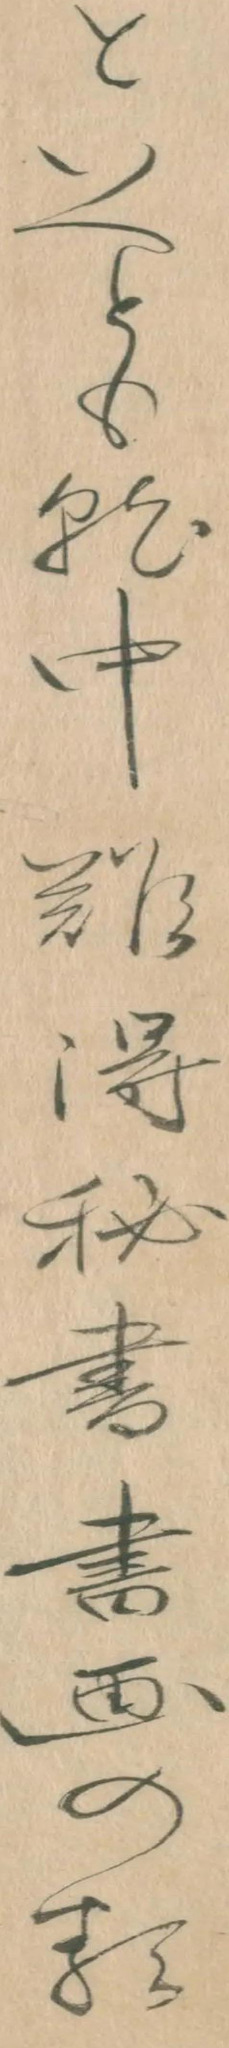といへとも就中難得秘書書画の類
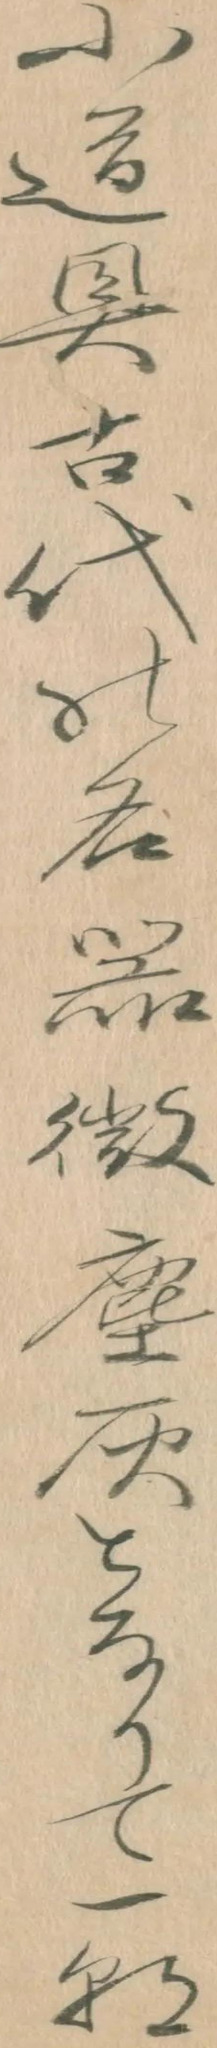小道具古代の名器微塵灰となりて一朝
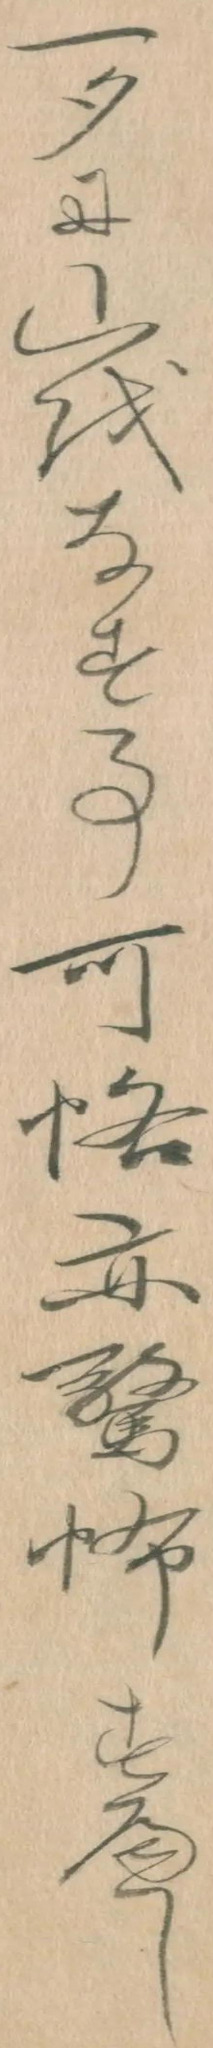一夕に山をなす事可恪亦驚怖すへし
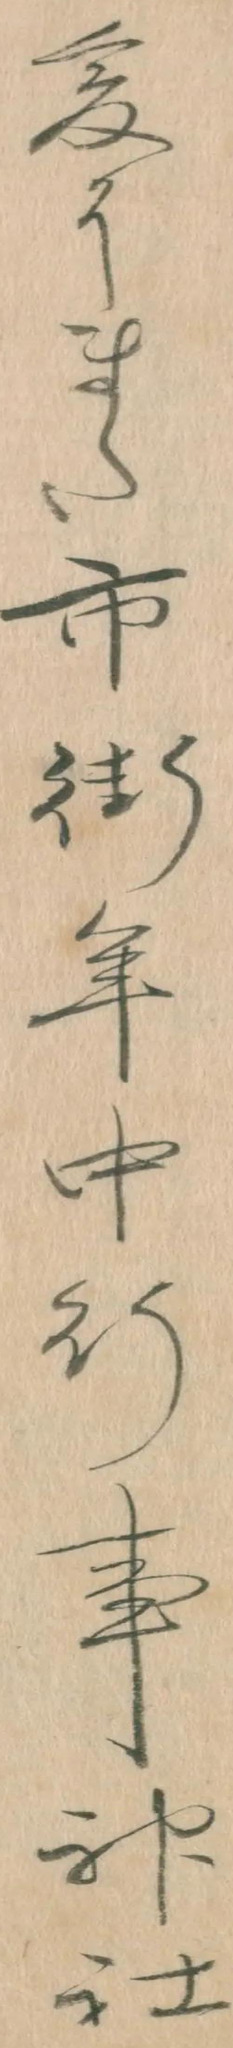爰にまた市街年中行事神社
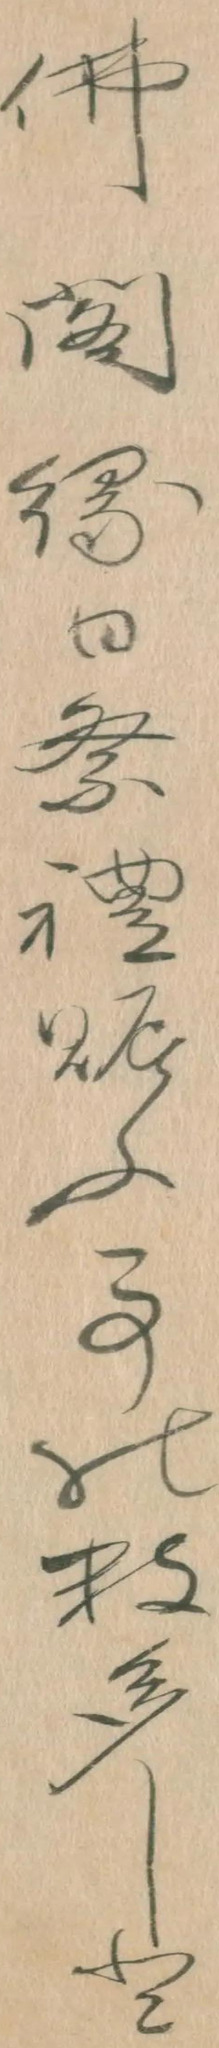佛閣縁日祭禮賑ふ事の数多しと
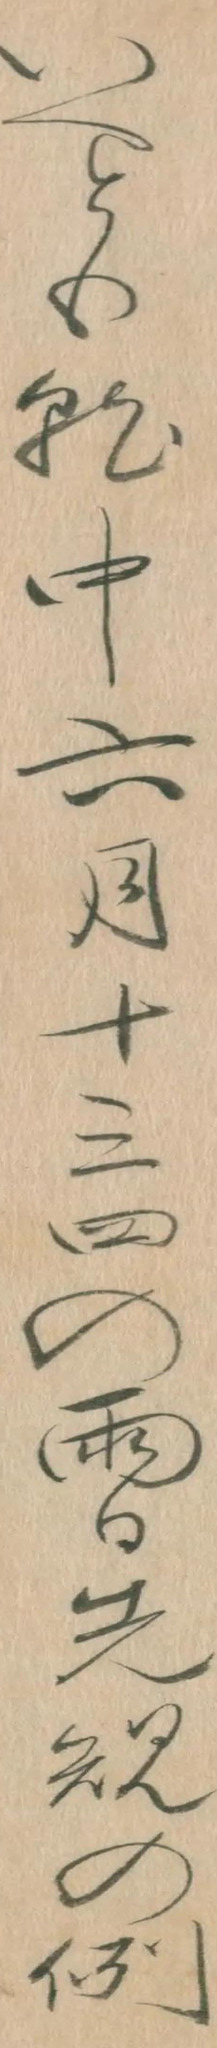いへとも就中六月十三四の両日先規の例
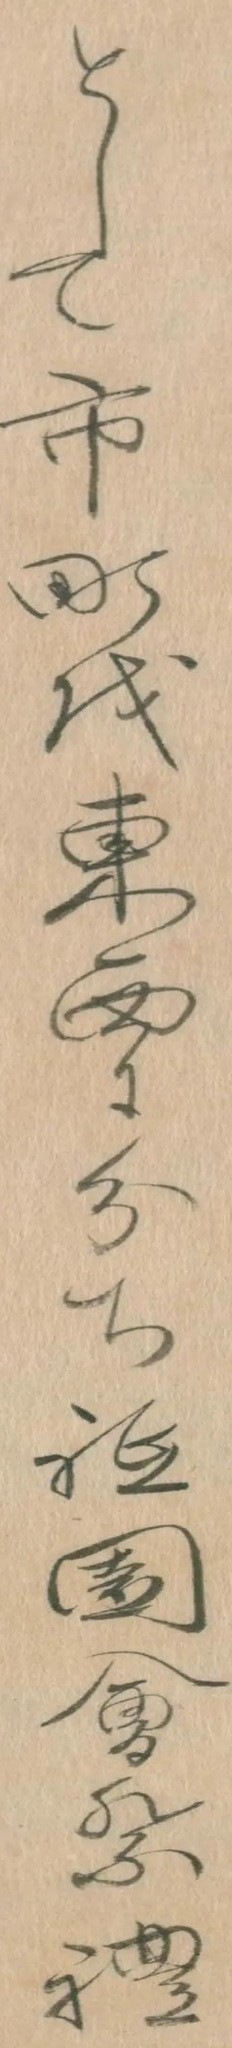として市町を東西に分ち祇園會祭禮
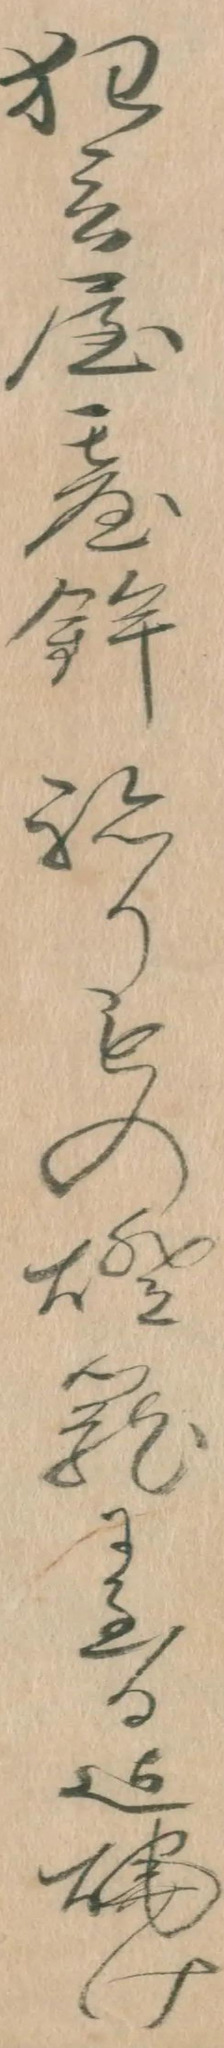狂言屋臺鉾とねりもの燈籠に至る迄焼け
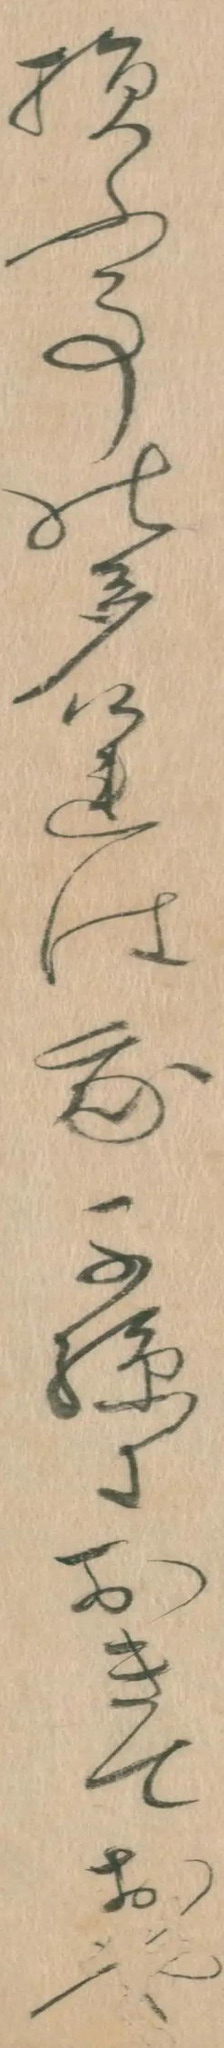損ふ事の多けれは我子様におきておや
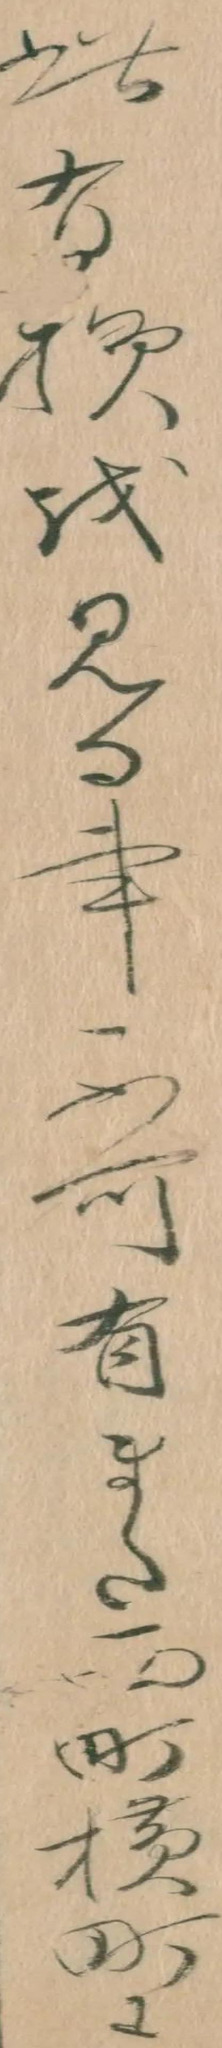此有様を見る事不可有また西町横町に
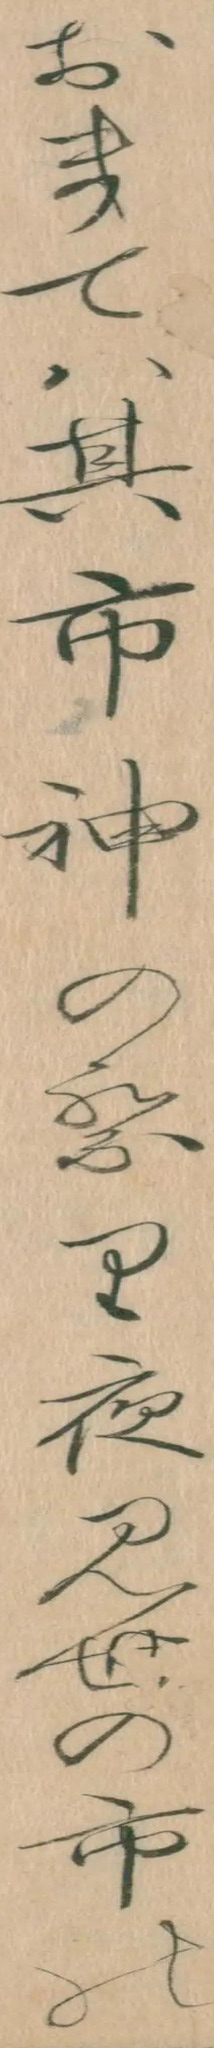おきては其市神の祭り夜見世の市の
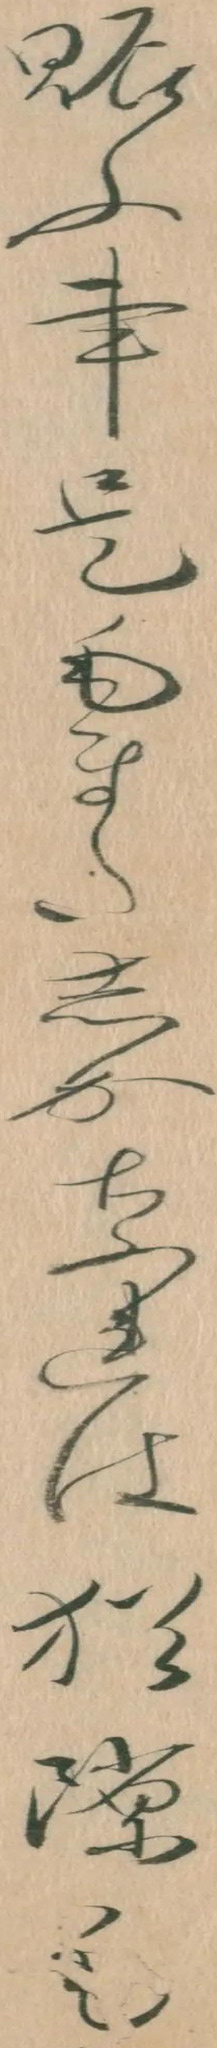賑ふ事是もまたしかなれは猶隙も
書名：俗語之種. [2]
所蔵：国立国会図書館 National Diet Library, JAPAN
